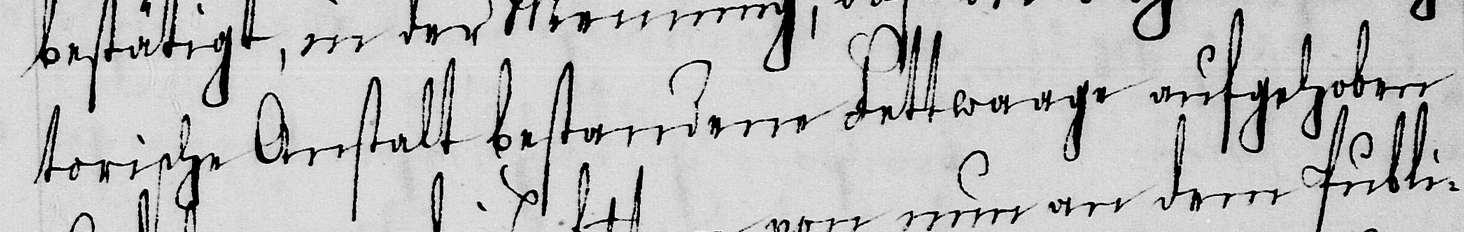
torische Anstalt bestandene Fettwaage aufgehoben
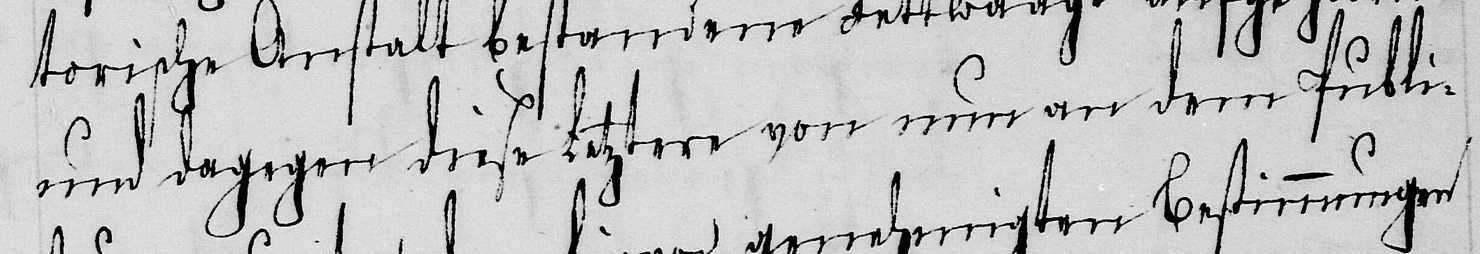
und dagegen diese Letztere von nun an dem Publi¬
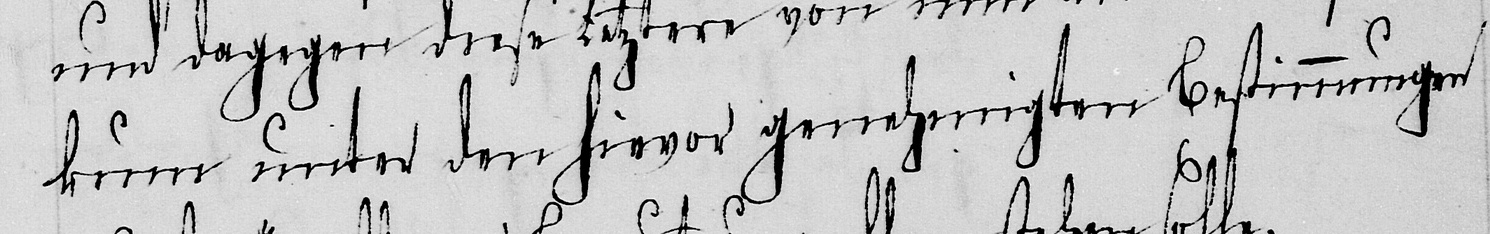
kum unter den hievor genehmigten Bestimmungen
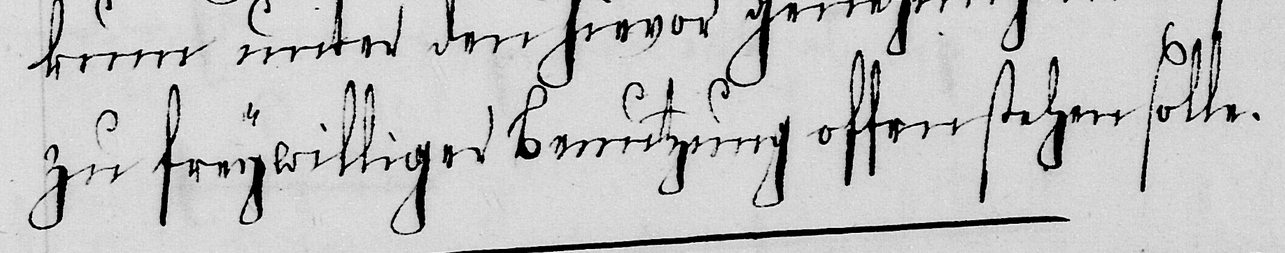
zu freywilliger Benutzung offen stehen soll¬
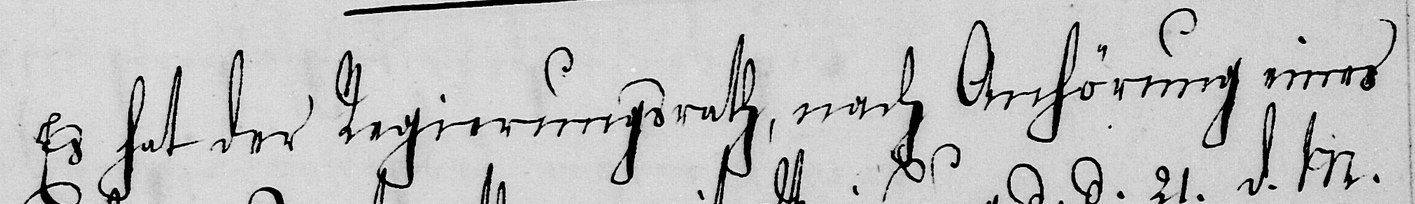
Es hat der Regierungsrath, nach Anhörung eines
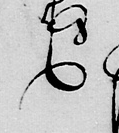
e.
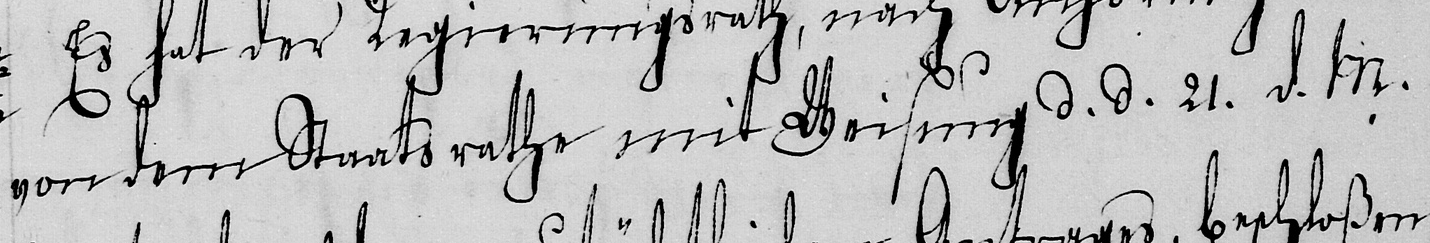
von dem Staatsrathe mit Weisung d. d. 21. d. M.
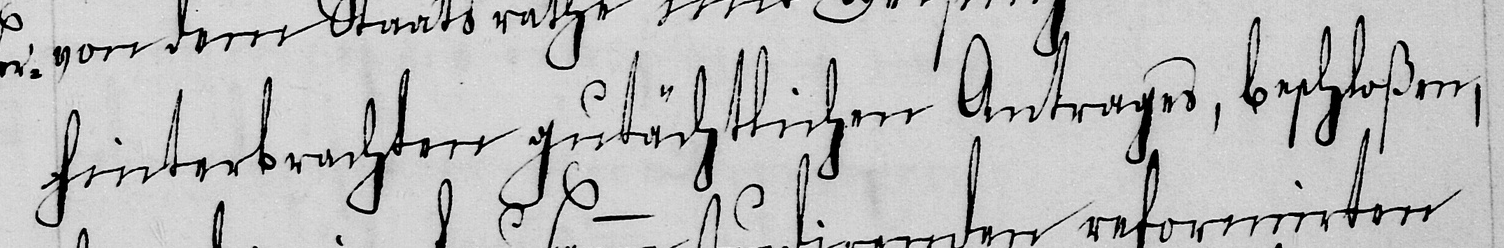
hinterbrachten gutächtlichen Antrages, beschloßen,
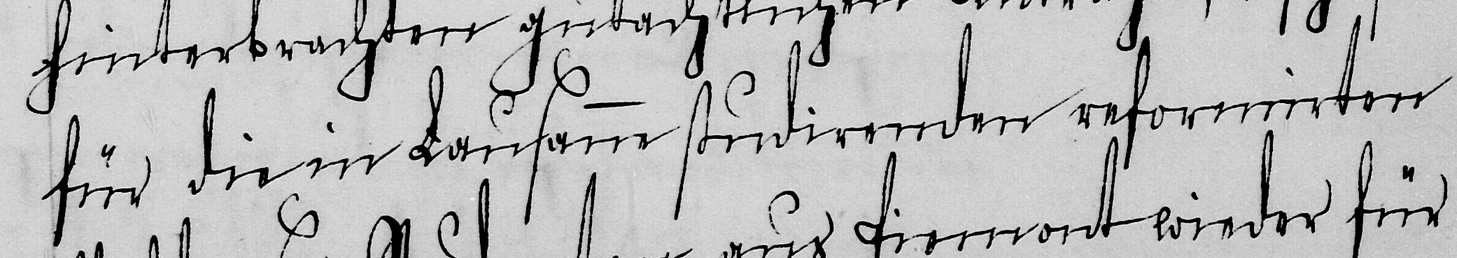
für die in Lausanne studirenden reformirten
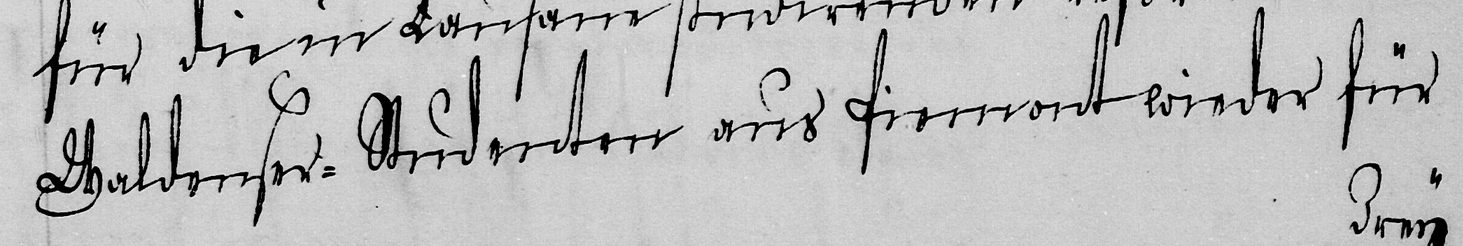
Waldenser-Studenten aus Piemont wieder für
